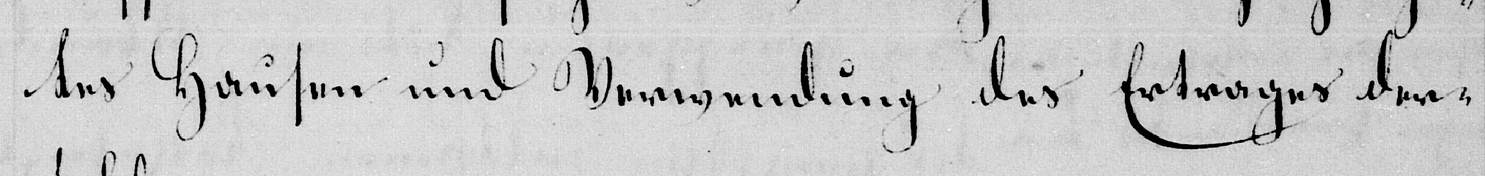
tes Hausen und Verwendung des Ertrages der¬
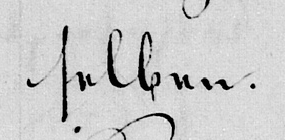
selben.
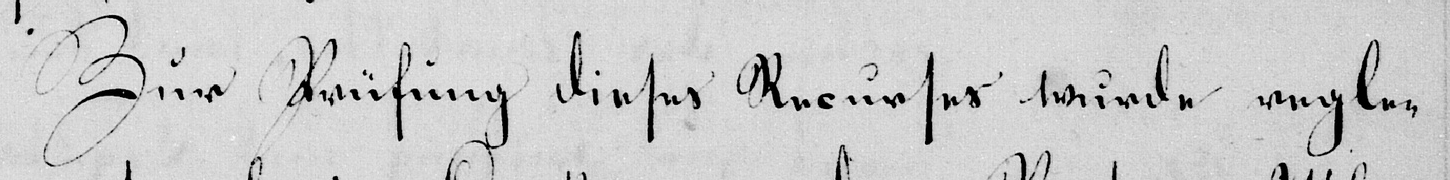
Zur Prüfung dieses Recurses wurde regle¬
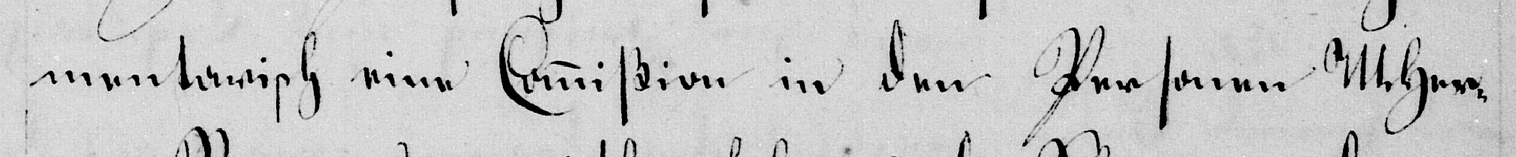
mentarisch eine Commißion in den Personen MHer¬
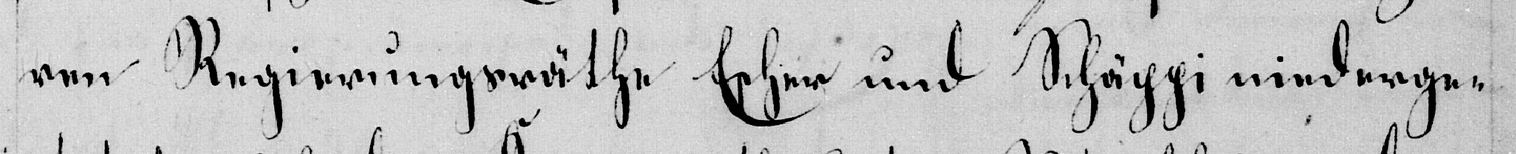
ren Regierungsräthe Escher und Schäppi niederge¬
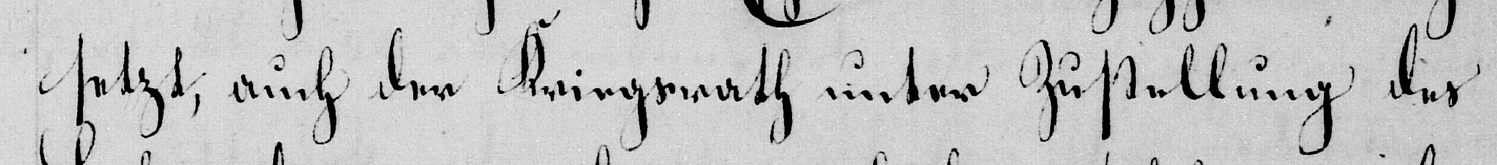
setzt, auch der Kriegsrath unter Zustellung des
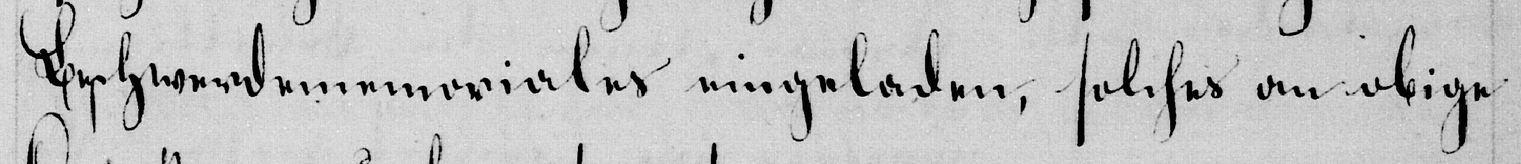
Beschwerdememoriales eingeladen, solches an obige
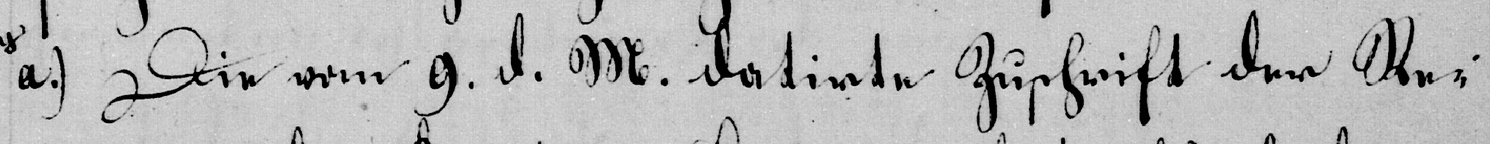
a.) Die vom 9. d. M. datirte Zuschrift der Re¬
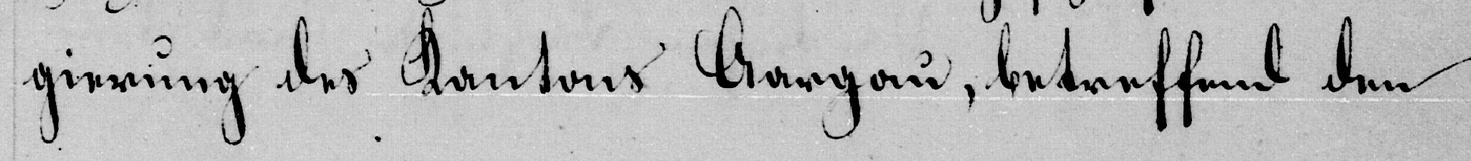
gierung des Kantons Aargau, betreffend den
